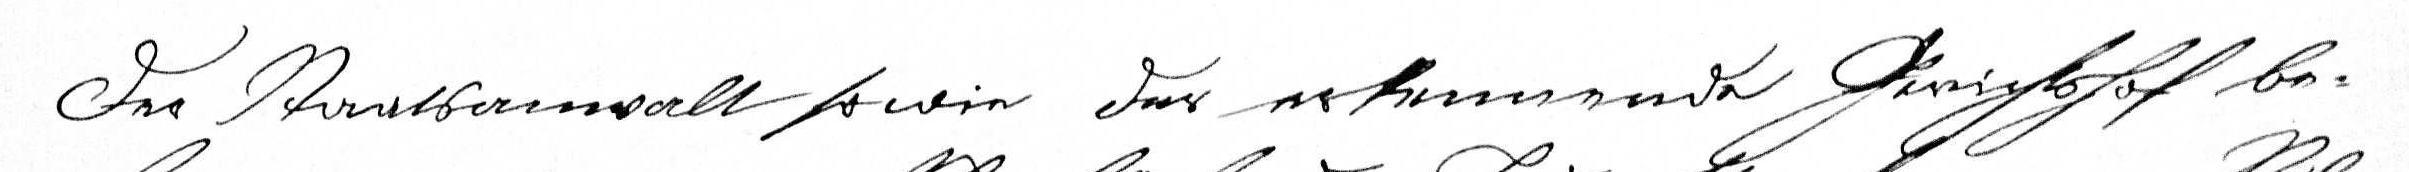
Der Staatsanwalt so wie der erkennende Gerichtshof be¬
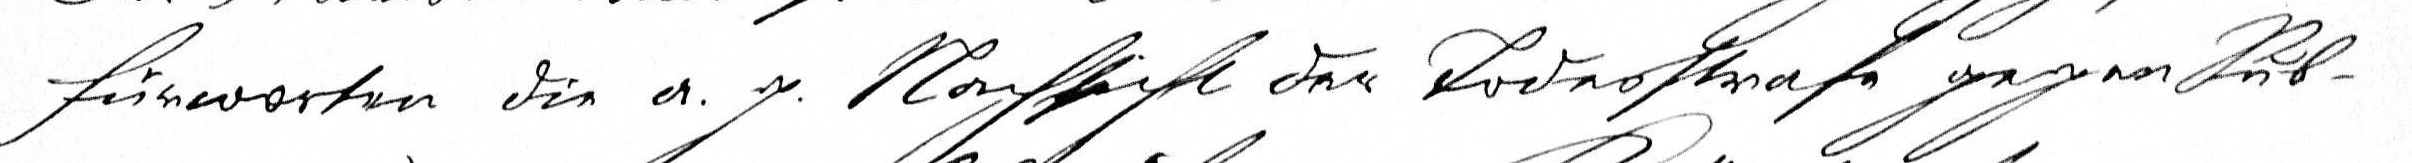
fürworten die a.g. Nachsicht der Todesstrafe gegen Sub¬
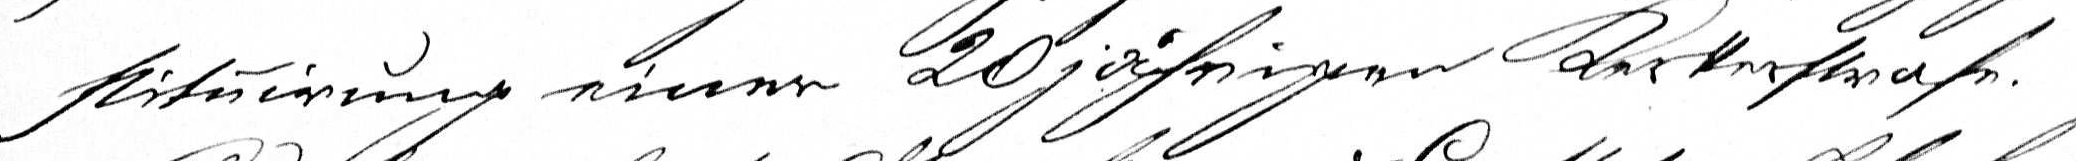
stituirung einer 20jährigen Kerkerstrafe.
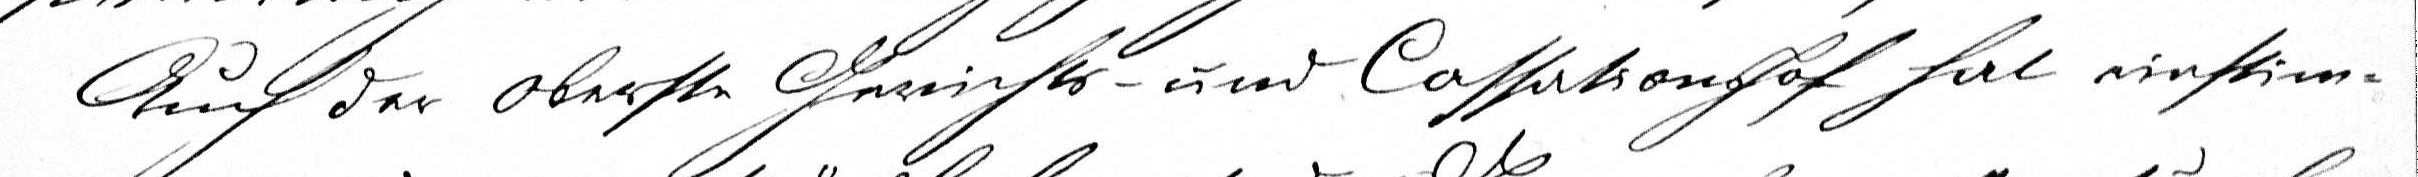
Auch der Oberste Gerichts- und Cassationhshof hat einstim¬
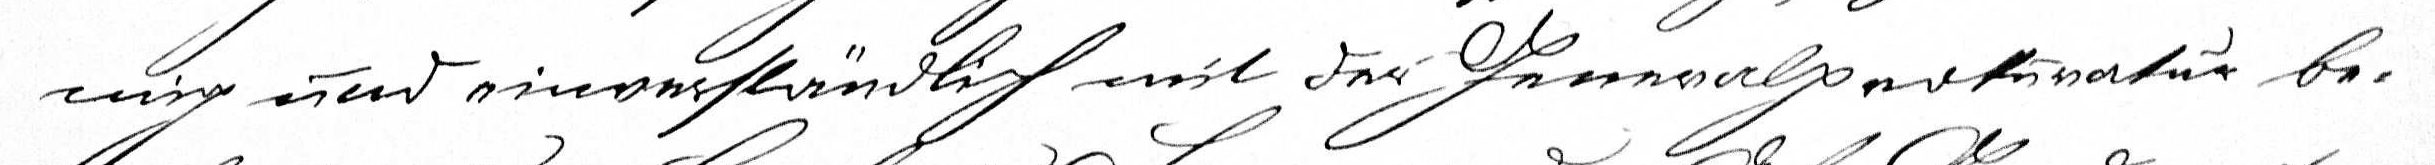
mig und einverständlich mit der Generalprokuratur be¬
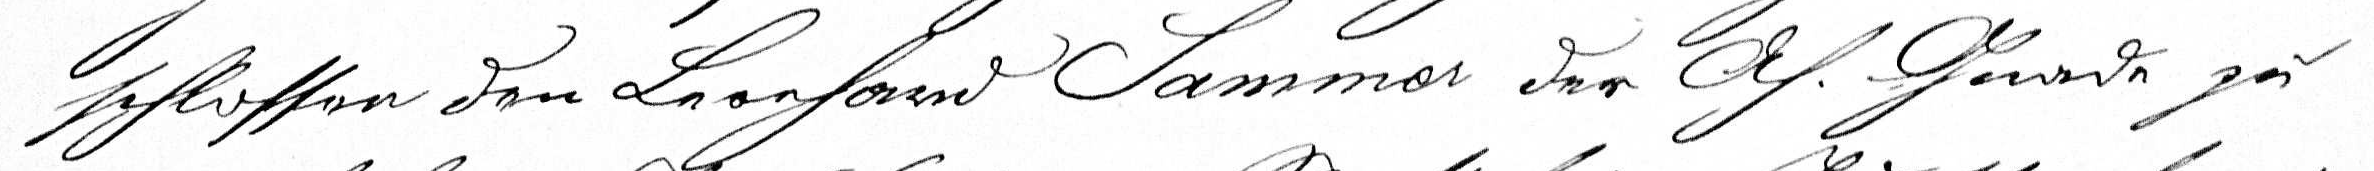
schlossen den Leonhard Sammer der Ah. Gnade zu
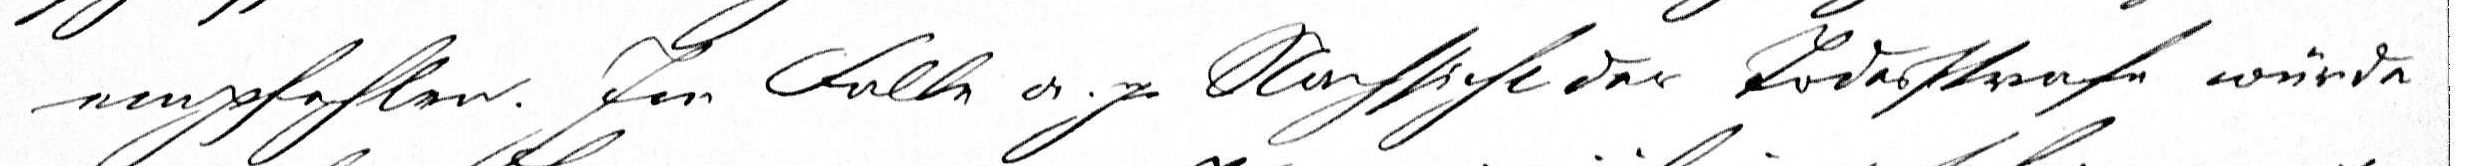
empfehlen. Im Falle a.g. Nachsicht der Todesstrafe würde
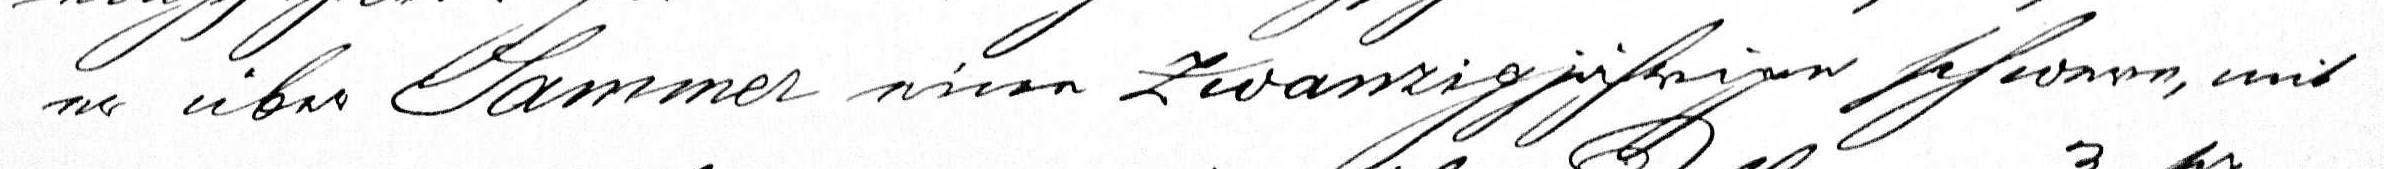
er über Sammer eine zwanzigjährigen schwere, mit
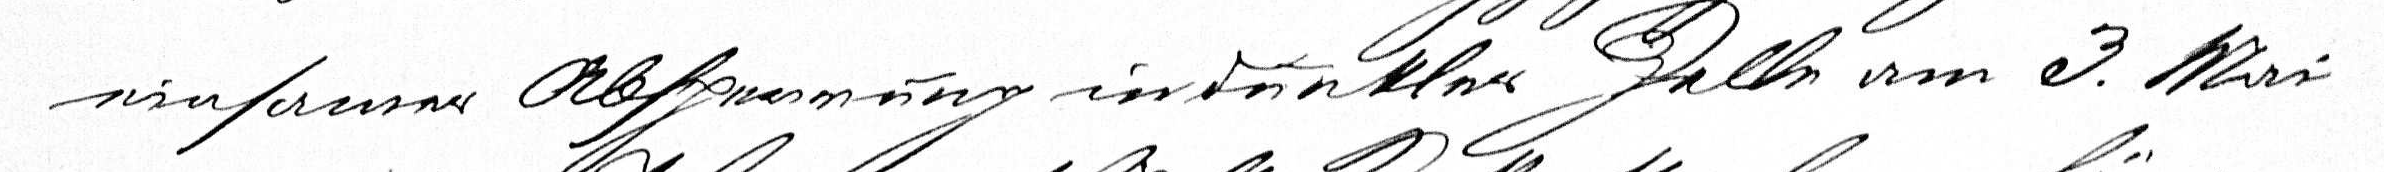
einsamer Absperrung in dunkler Zelle am 3. Mai
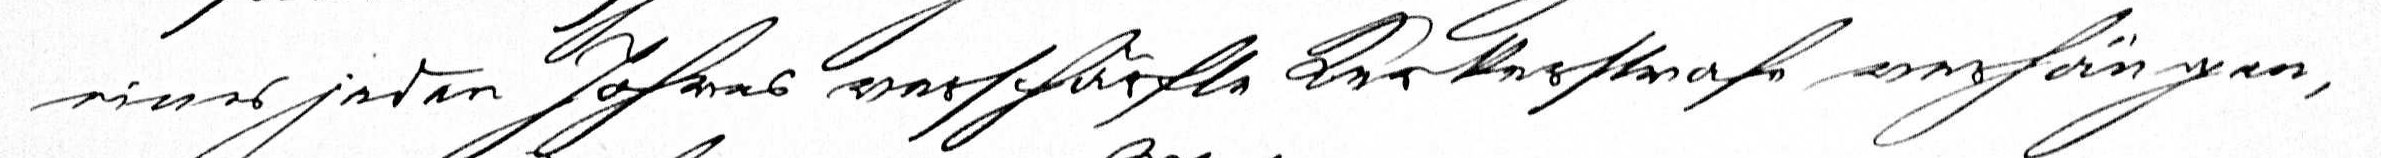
eines jeden Jahres verschürfte Kerkerstrafe verhängen,
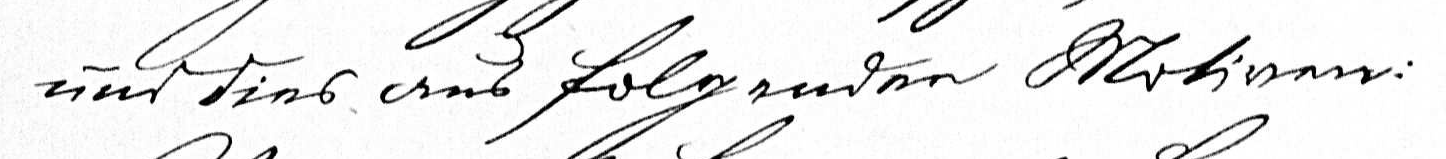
und dies aus folgenden Motiven:
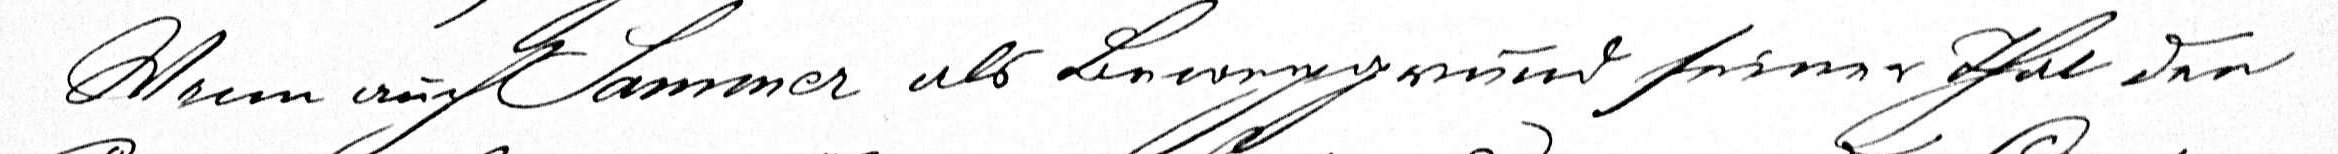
Wenn auch Sammer als Bewegunggrund seiner That den
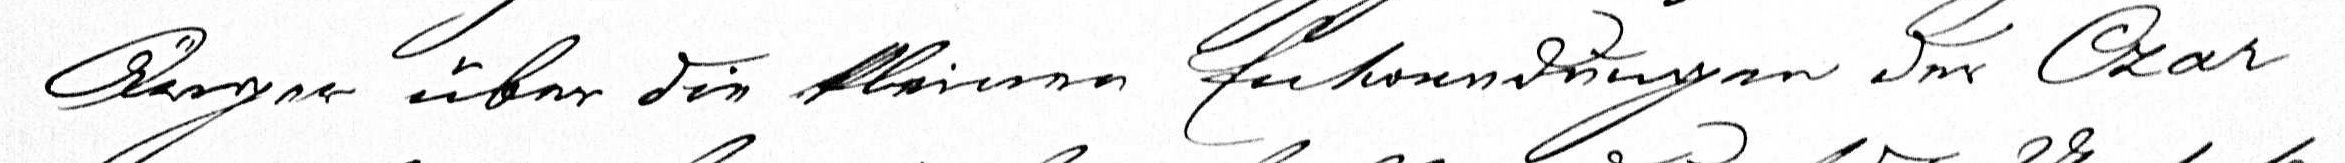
Ärger über die kleinen Entwendungen der Czar
